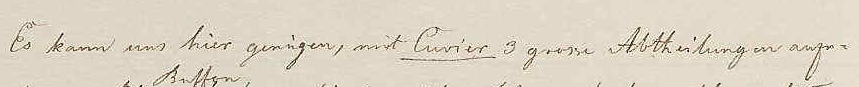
Es kann uns hier genügen, mit Cuvier 3 grosse Abtheilung anzu-
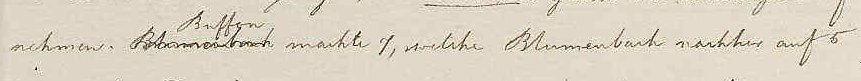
nehmen. BlumenbachBuffon machte 7, welche Blumenbach nachher auf 5
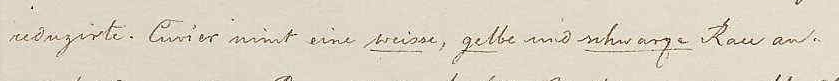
reduzirte. Cuvier nimt eine weisse, gelbe und schwarze Race an.
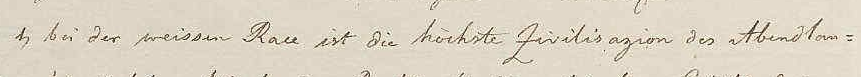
1, bei der weissen Race ist die höchste Zivilisazion des Abendlan-
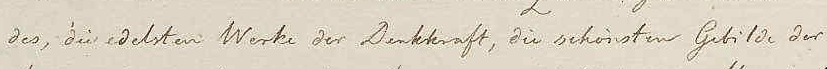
des, die edelsten Werke der Denkkraft, die schönsten Gebilde der
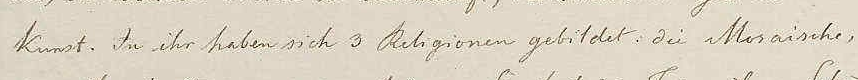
Kunst. In ihr haben sich 3 Religionen gebildet: die Mosaische,
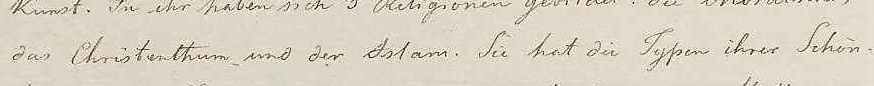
das Christenthum und der Islam. Sie hat die Typen ihrer Schön-
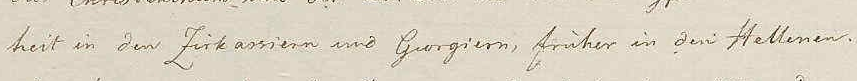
heit in den Zirkassiern und Georgiern, früher in den Hellenen.
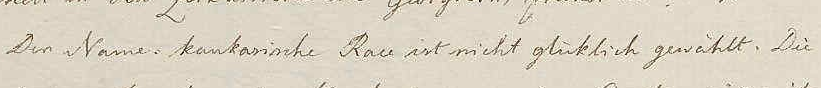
Den Name: kaukasische Race ist nicht glüklich gewählt. Die
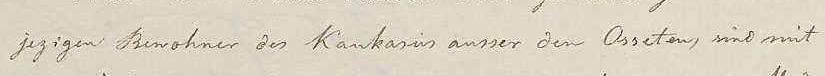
jezigen Bewohner des Kaukasus ausser den Osseten, sind mit
